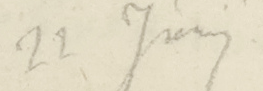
21 Junij
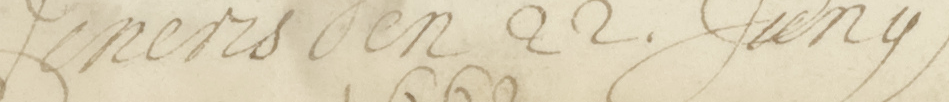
Veneris den 22e. Junij,
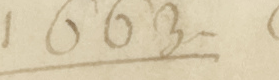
1663.
